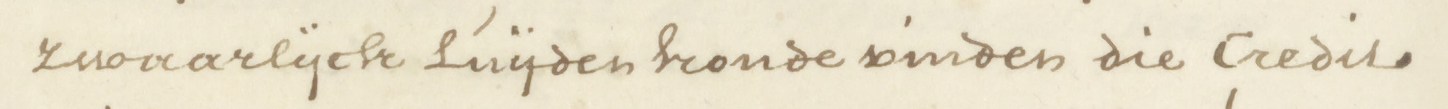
zwaarlijck luijden konde vinden die Credit
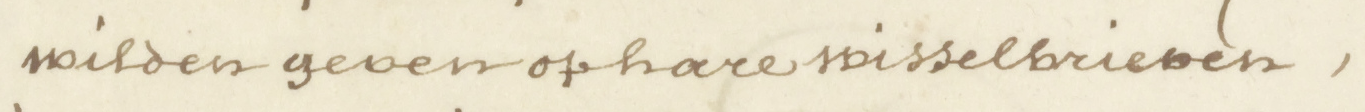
wilden geven op hare wisselbrieven,
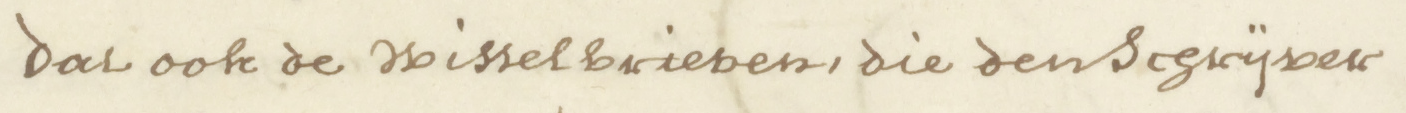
dat ook de wisselbrieven, die den schrijver
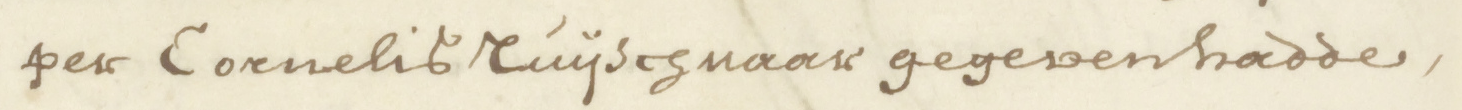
per Cornelis Ruijschnaar gegeven hadde,
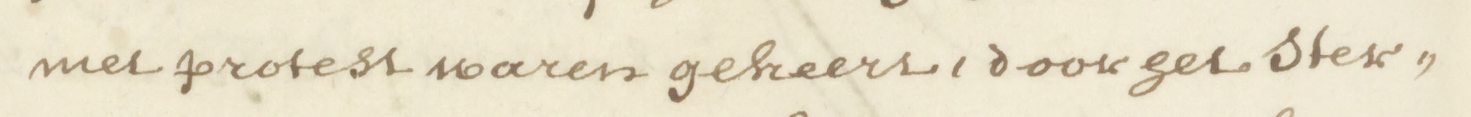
met protest waren gekeert, door het ster„
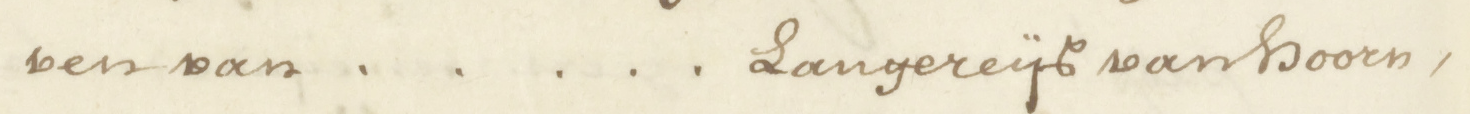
ven van . . . . . Langereijs van Hoorn,
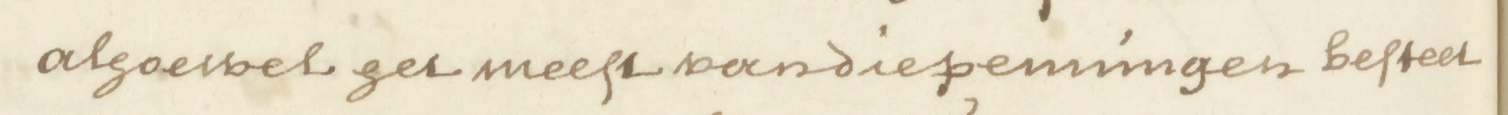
alhoewel het meest van die penningen besteet
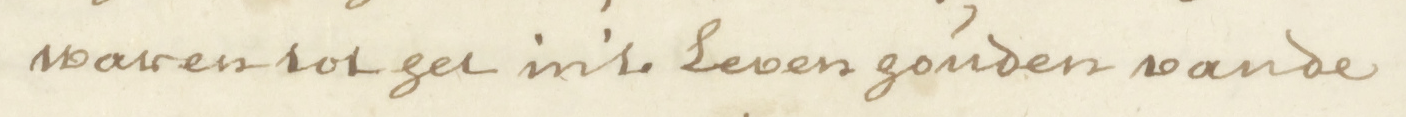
waren tot het in't Leven houden vande
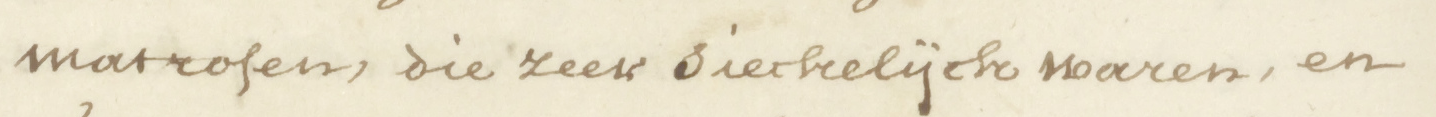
matrosen, die zeer sieckelijck waren, en
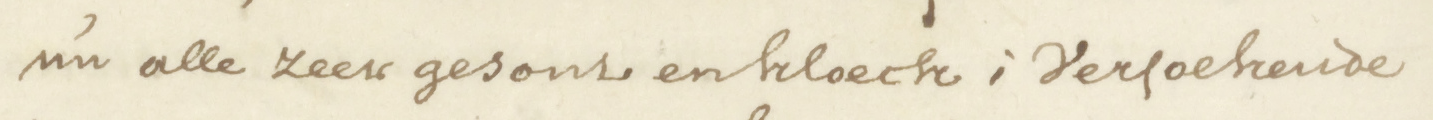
nu alle zeer gesont en kloeck; Versoekende
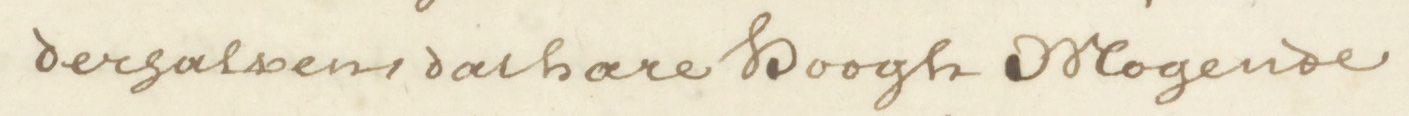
derhalven, dat hare Hoogh Mogende
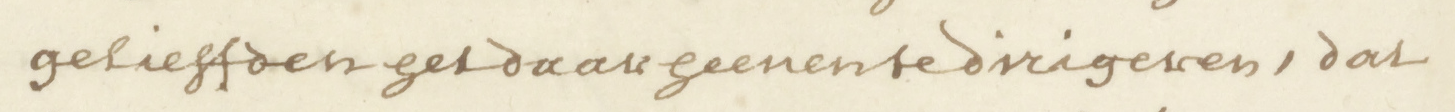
gelieffden het daar heenen te dirigeren, dat
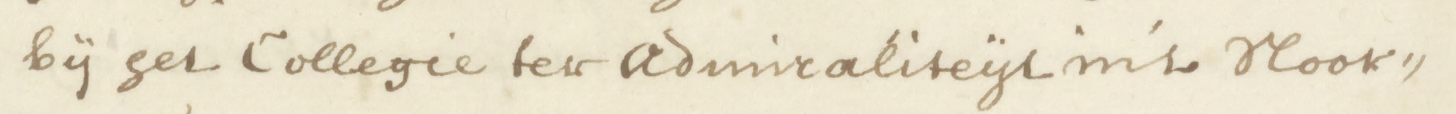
bij het Collegie ter Admiraliteijt int Noor„
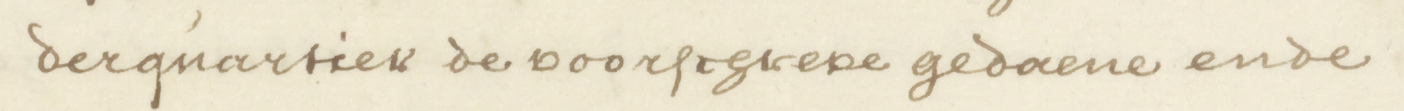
derquartier de voorschreve gedaene ende
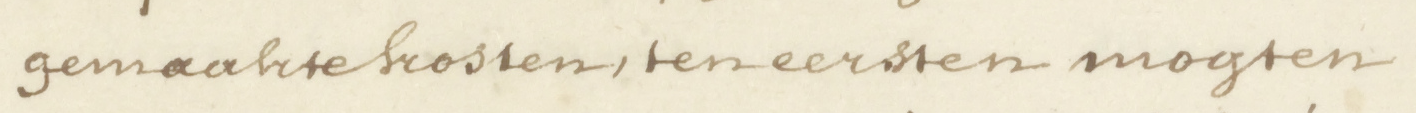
gemaakte kosten, ten eersten mogten
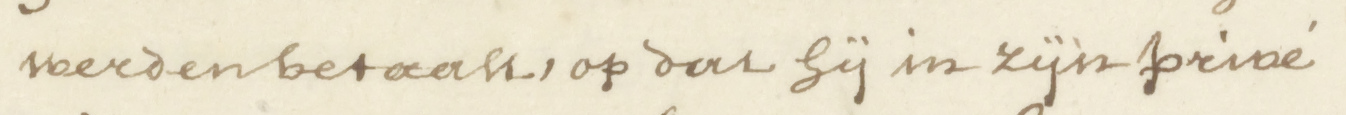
werden betaalt, op dat hij in zijn prive
